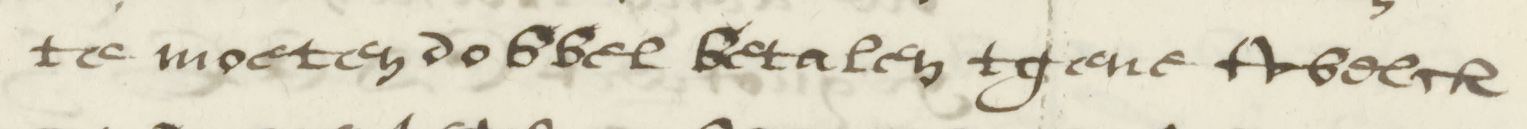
te moeten dobbel betalen tgene twelck
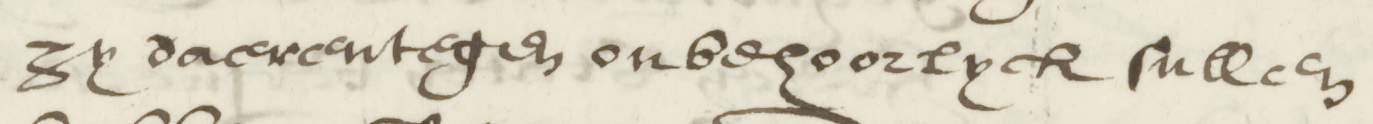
zy daerentegen onbehoorlyck sullen
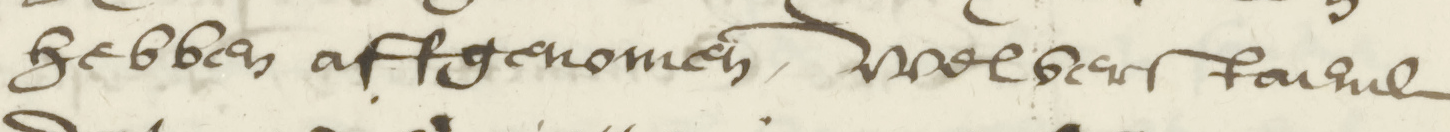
hebben affgenomen. Welverstaende
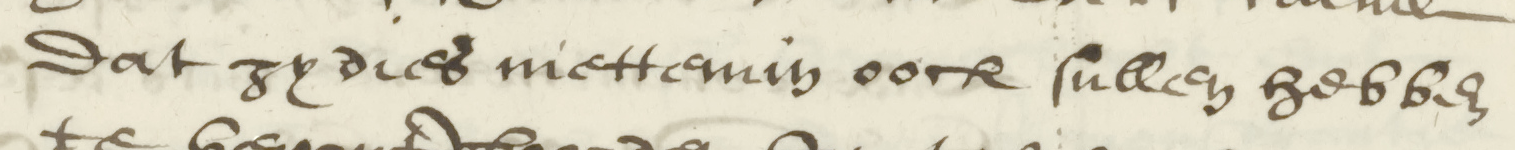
dat zy dies niettemin oock sullen hebben
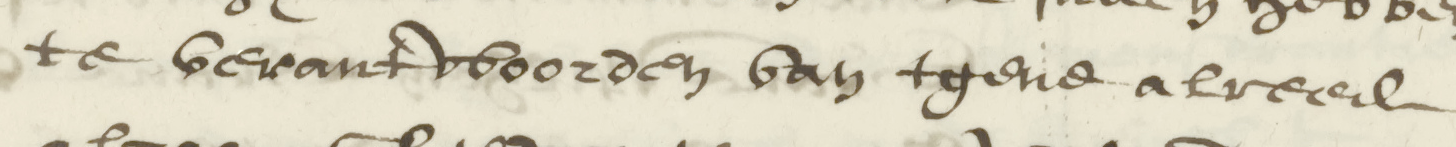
te verantwoorden van tgene alreede
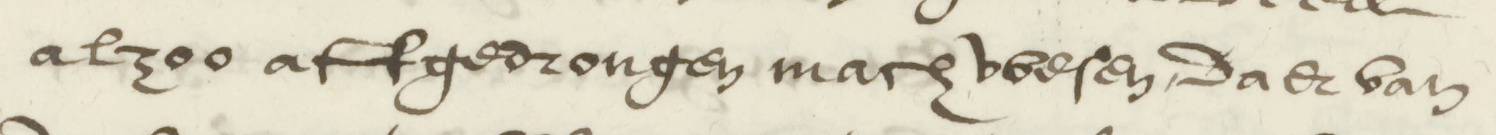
alzoo affgedrongen mach wesen, daer van
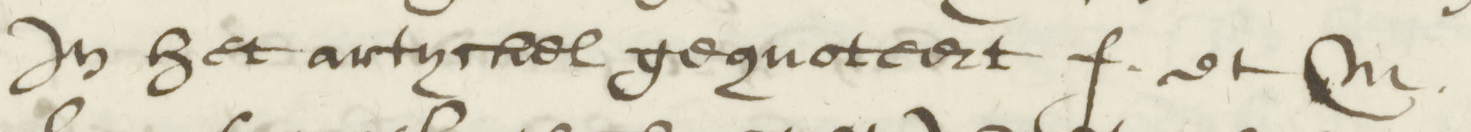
In het artyckel gequoteert F. et M.
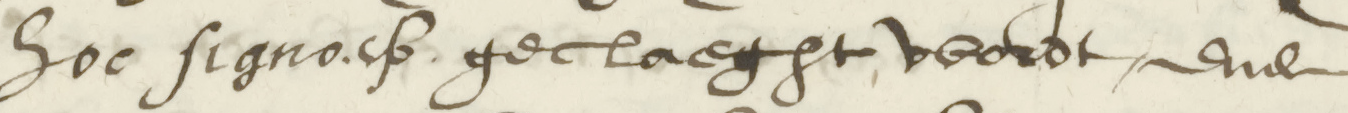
hoc signo Ꝕ. geclaeght wordt, ende
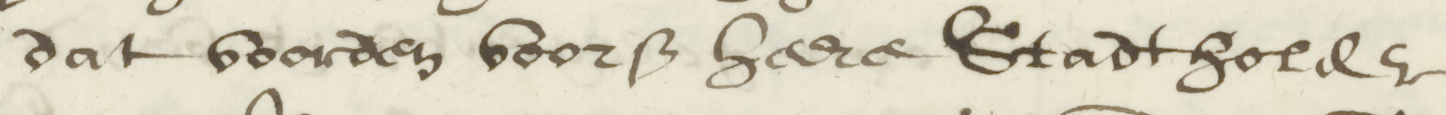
dat voorden voors heere Stadtholder
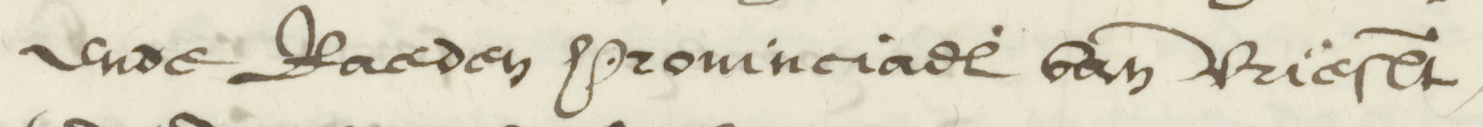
ende Raeden provinciael van Vrieslnt
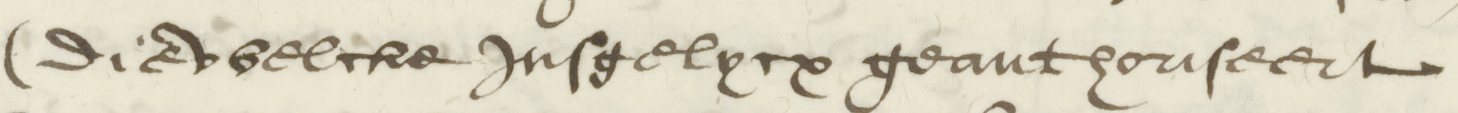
(diewelcke insgelycx geauthoriseert
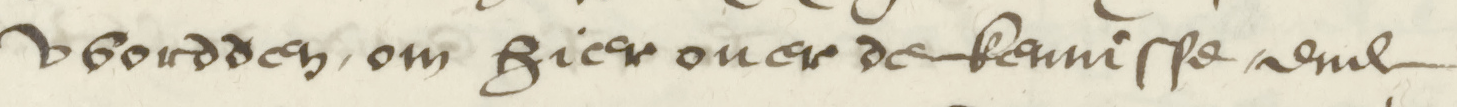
wordden om hier ouer de kennisse ende
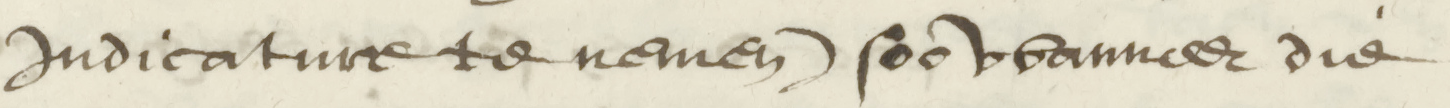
judicature te nemen) soo wanneer die
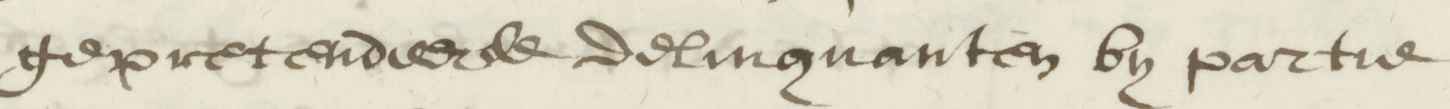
gepretendeerde delinquanten by partie
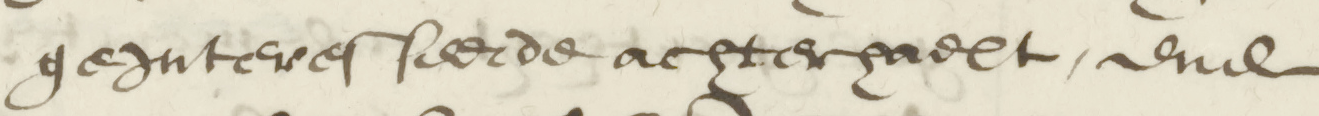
geinteresseerde achterhaelt, ende
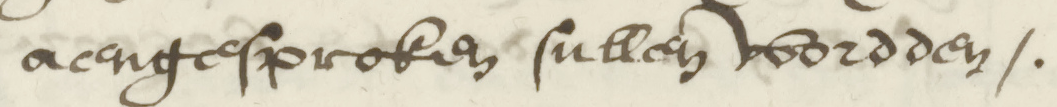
aengesproken sullen wordden.
